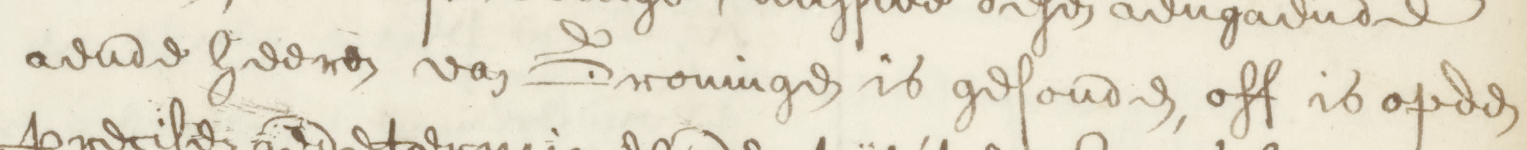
aende heeren van Groningen is gesonden, off is opden
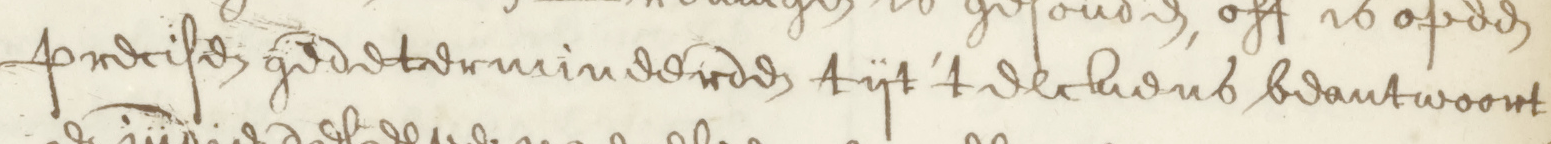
precisen gedetermineerden tijt ‛telckens beantwoort,
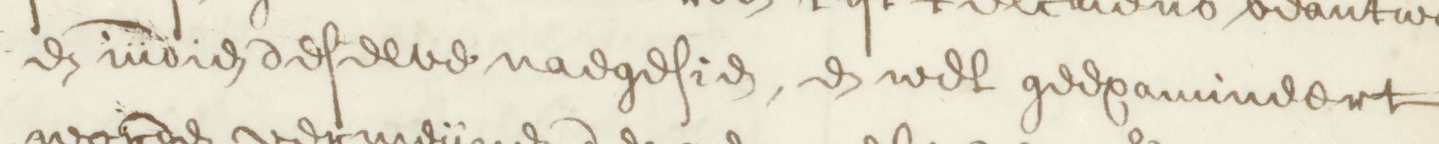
en indien deselve naegesien, en wel geexamineert
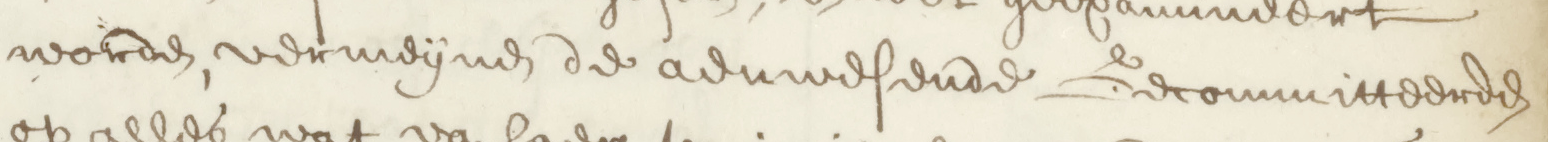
worden, vermeijnen de aenwesende Gecommitteerden
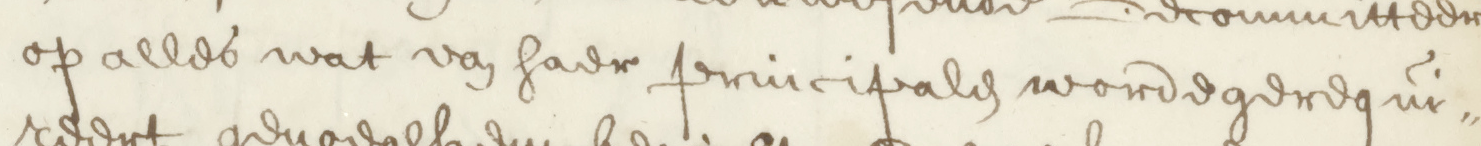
op alles wat van haer principalen worde gerequi„
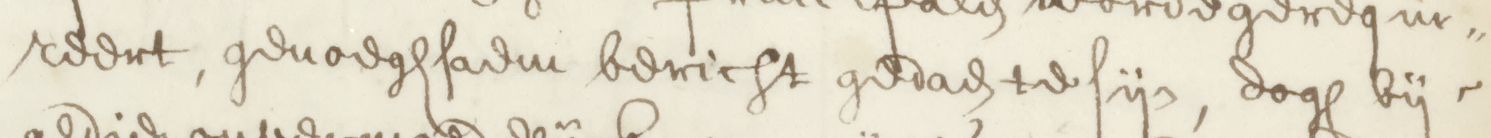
reert, genoeghsaem bericht gedaen te sijn, dogh bij
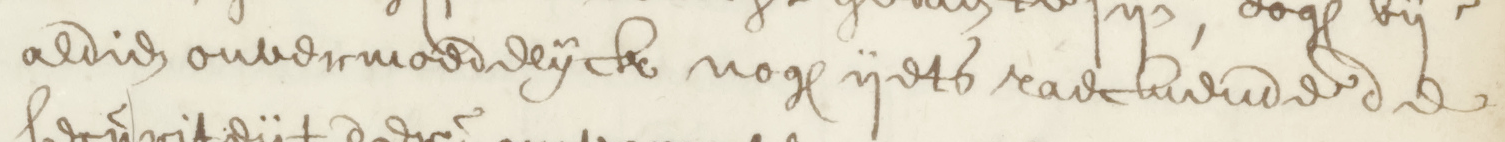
aldien onvermoedelijck nogh ijets raeckende de
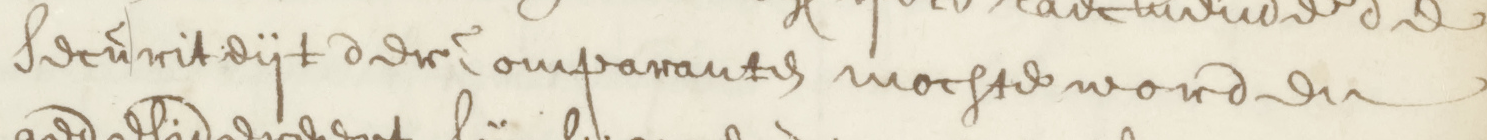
Securiteijt der Comparanten mochte worden
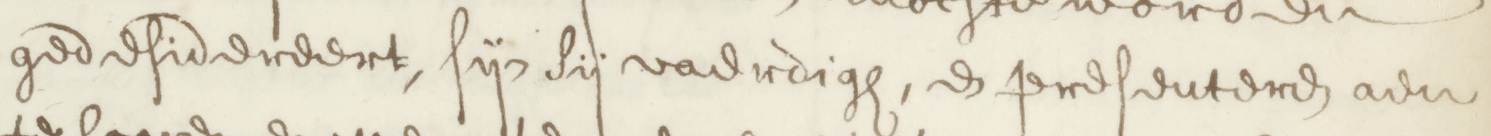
gedesidereert, sijn Sij vaerdigh, en presenteren aen
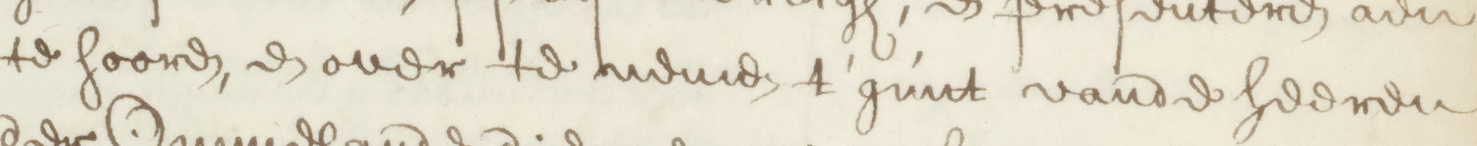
te hooren, en over te nemen t'gunt vande heeren
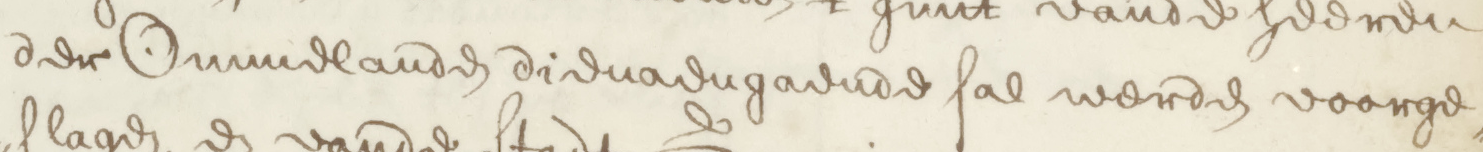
der Ommelanden dienaengaende sal werden voorge„
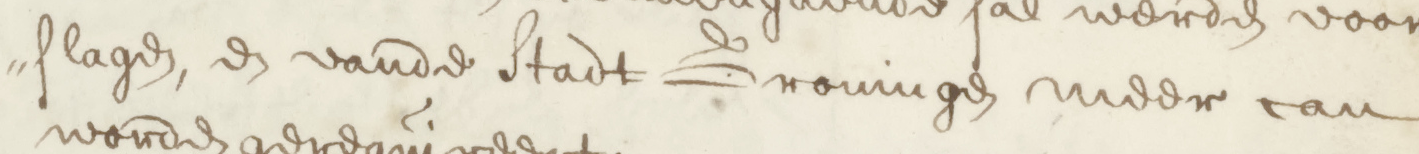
„slagen, en vande Stadt Groningen meer can
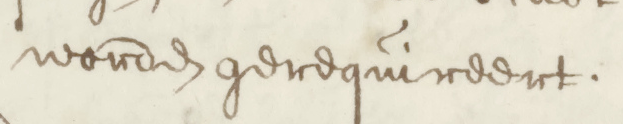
worden gerequireert.
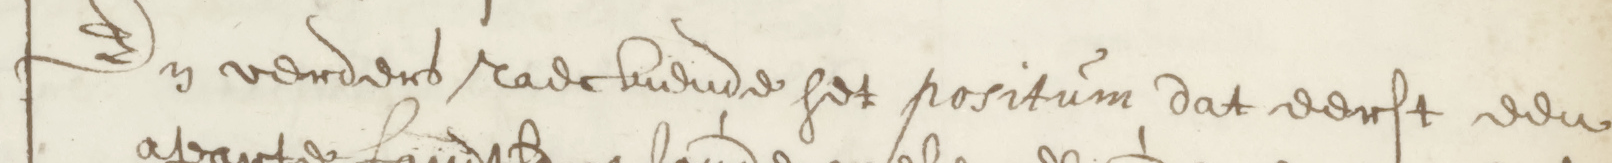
En verders, raeckende het positum dat eerst een
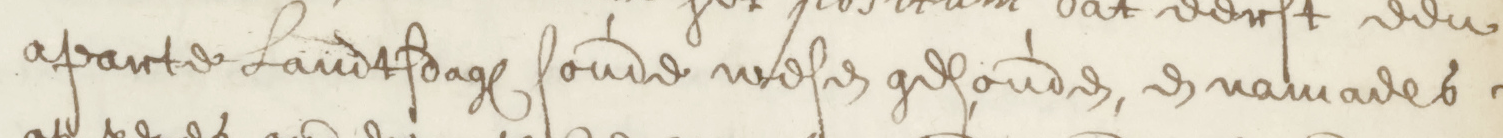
aparte Landtsdagh soude wesen gehouden, en namaels
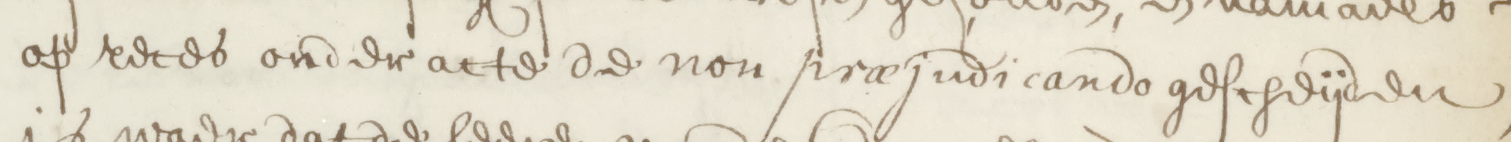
op reces onder acte de non præjudicando gescheijden,
